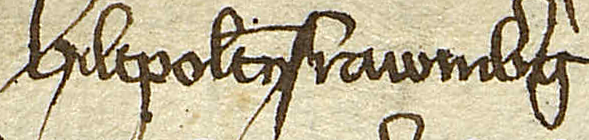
hilpoltn* frawmb*g*
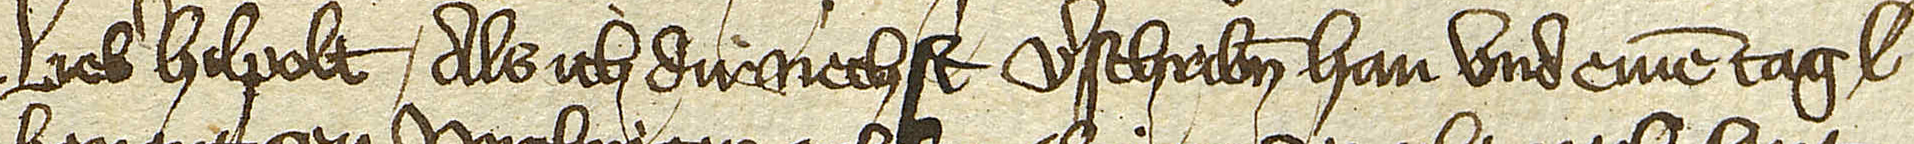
Lieb* hilpolt / Als ich dir nechſt v*ſchribn* han vnd eine* tag l
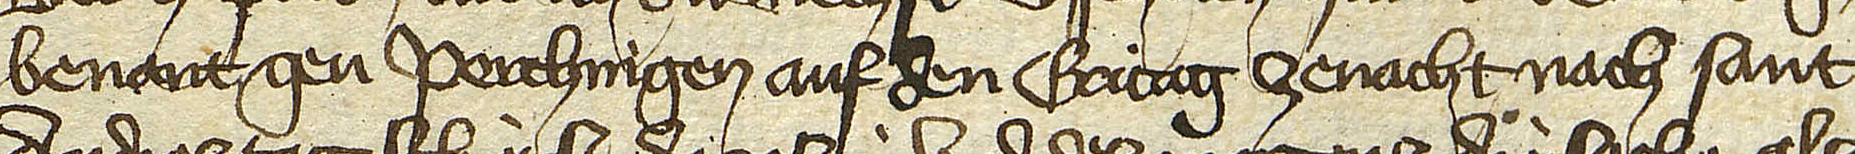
benant gen Perchingen auf den Eritag cʒenacht nach ſant
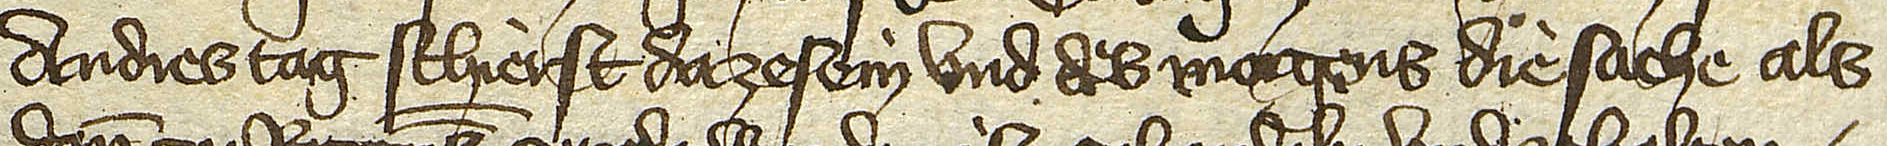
Andres tag ſchierſt daʒeſein vnd des morgens die ſache als
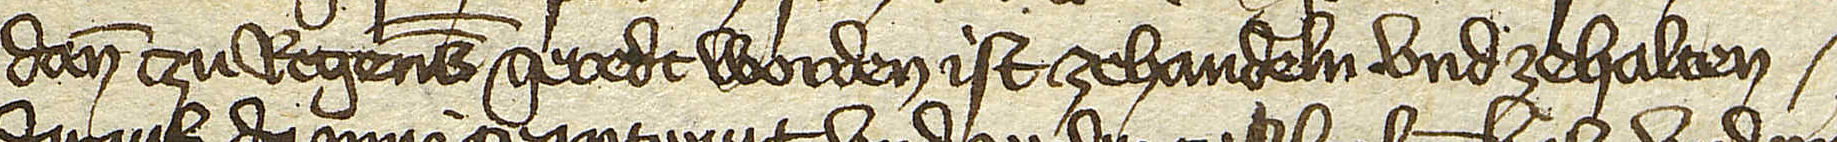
dan* cʒu Regens* geredt worden iſt cʒehandeln vnd cʒehalten /
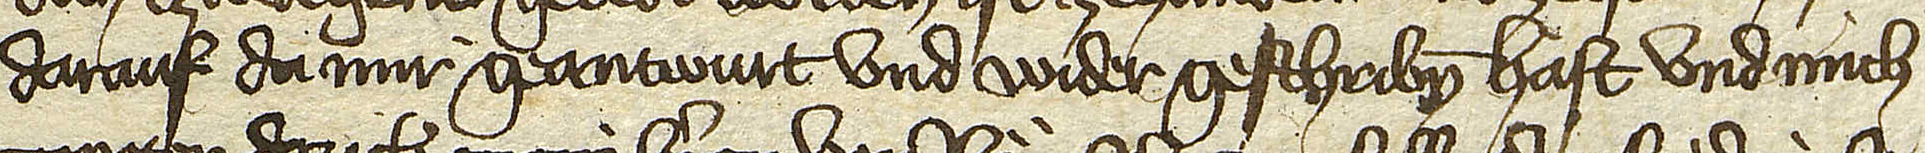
darauf du mir geantwurt vnd wider geſchribn* haſt vnd mich
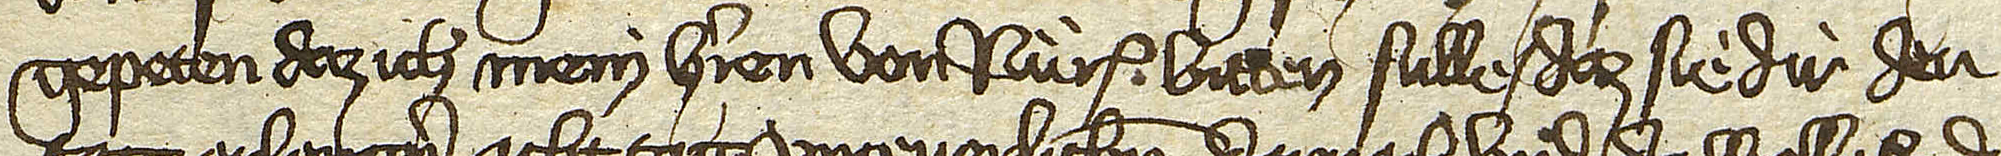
gepeten daʒ ich mein h*ren von Nür* bitten ſulle / daʒ ſie dir den
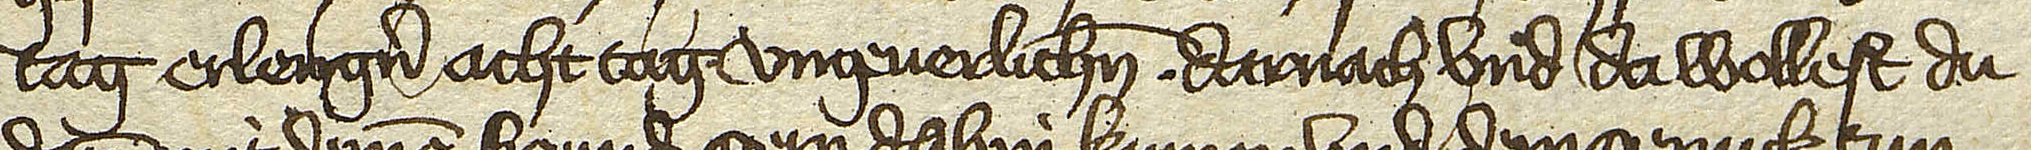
tag erlengn* acht tag vngeuerlichn*. darnach vnd da wolleſt du
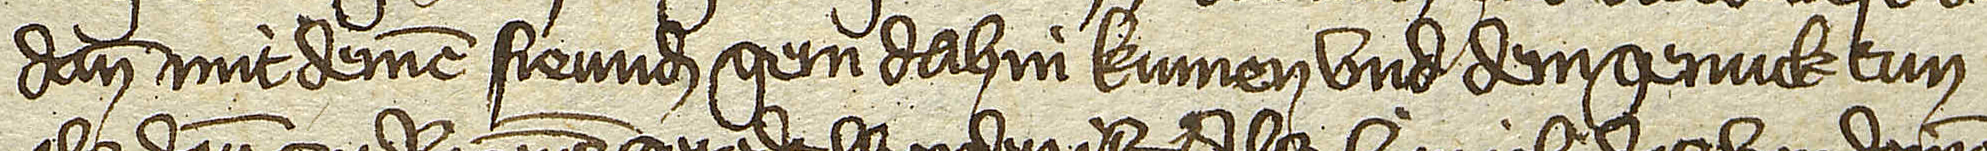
dan* mit deine* freund* gern dahin kumen vnd dem genuck tun
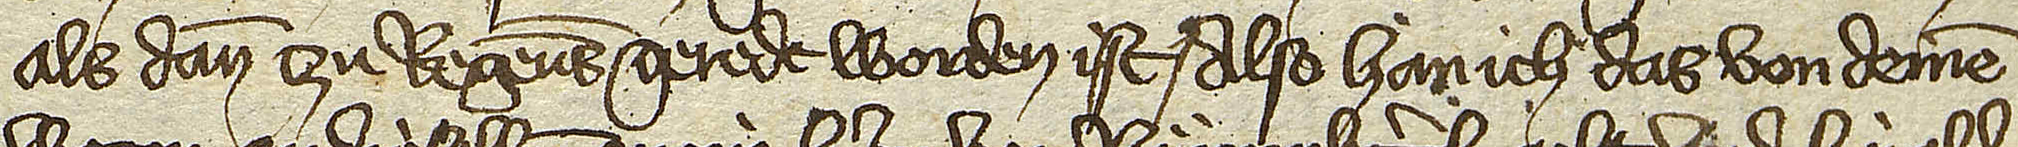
als dan* cʒu Regens* geredt worden iſt / Alſo han ich das von deine*
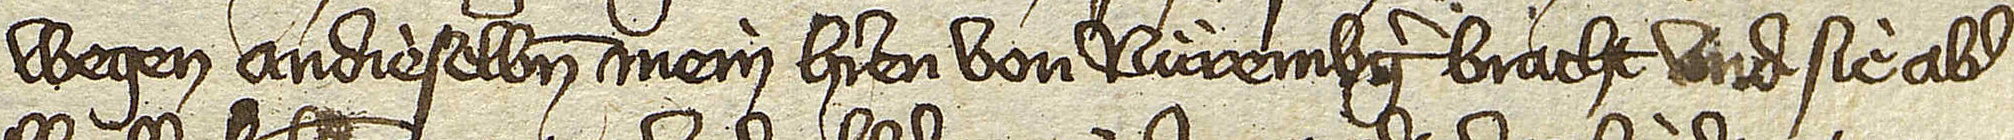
wegen andieſelbn* mein hr*en von Nüremb*g bracht vnd ſie ab*
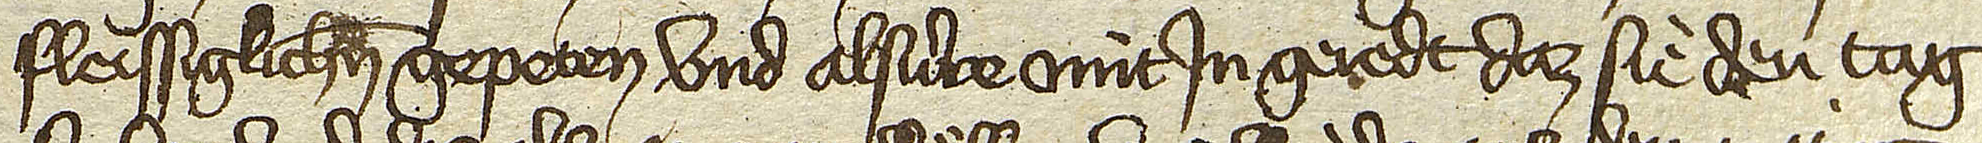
fleiſſiglichn* gepeten vnd alſu*re mit In geredt daʒ ſie den tag
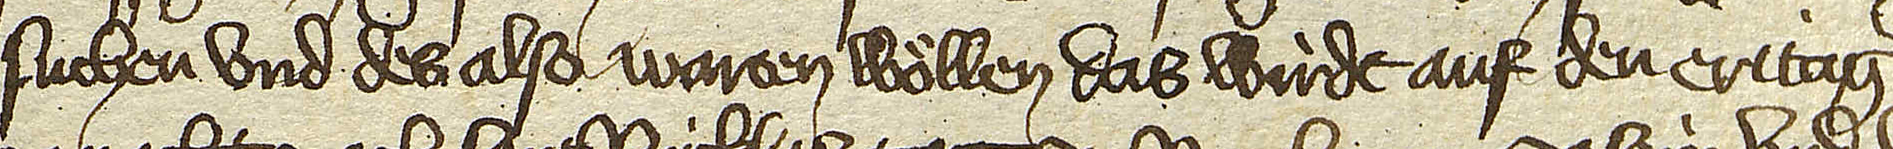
ſuchen vnd des alſo warten wöllen das wirdt auf den eritag
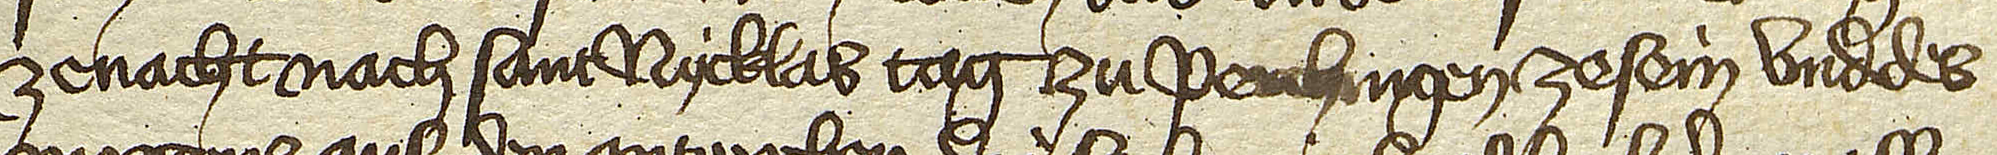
cʒenacht nach ſant Nycklas tag cʒu Perchingen cʒeſein vnd des
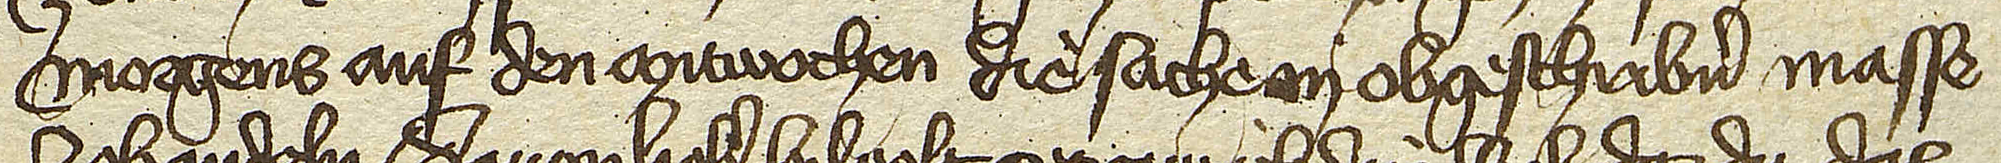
morgens auf den Mitwochen die ſache in obgeſchribn* maſſe
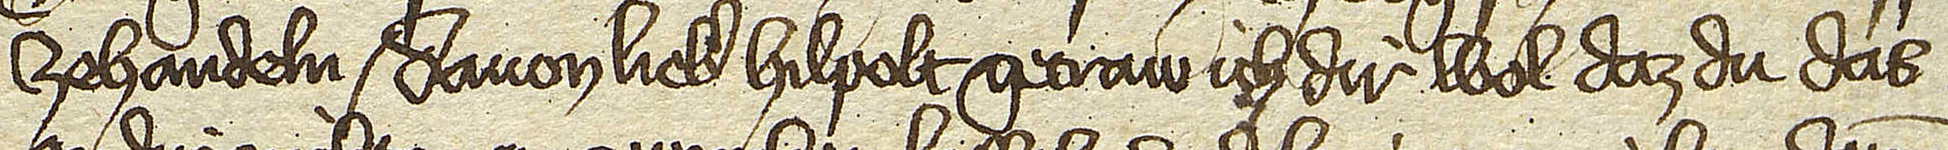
cʒehandeln / dauon lieb* hilpolt getraw ich dir wol daʒ du das
